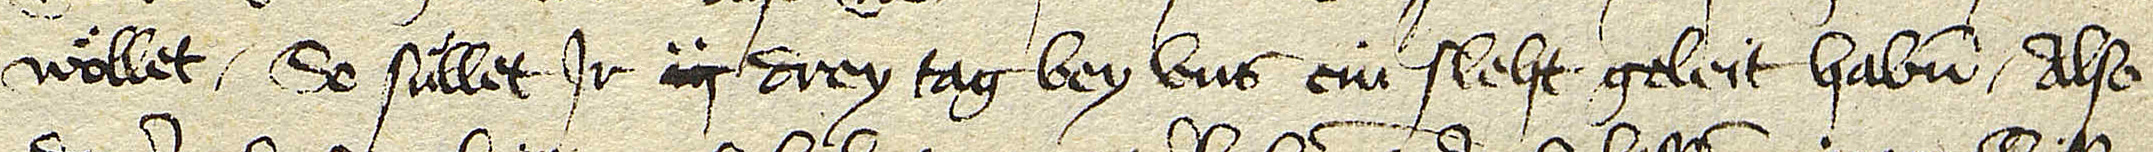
wöllet / So ſüllet Ir iii drey tag bey vns ein ſleht geleit habn* / Alſo
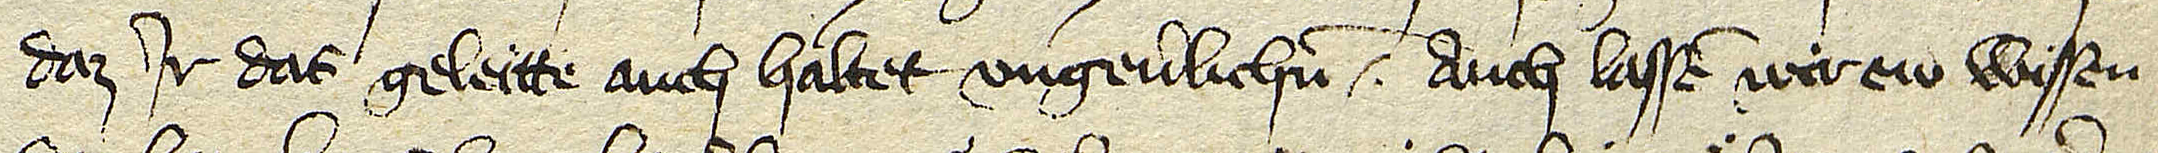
daʒ Ir das geleitte auch haltet vngeu*lichn* / . Auch laſſe* wir ew wiſſen
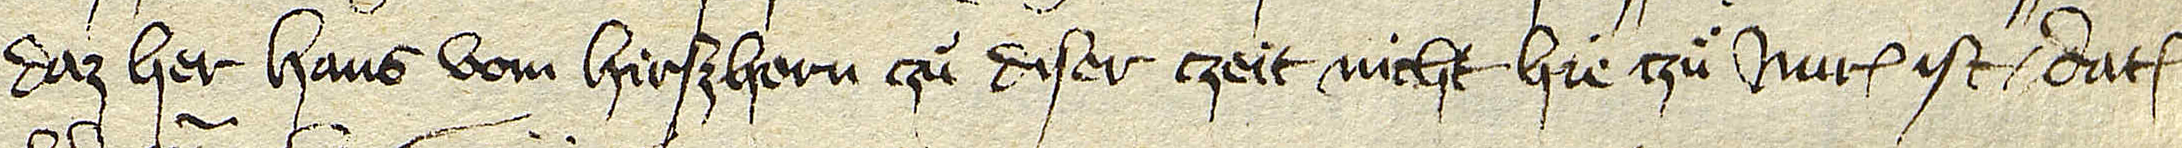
daʒ her hans von hirſʒhorn cʒü cʒeit nicht hie cʒü Nur* iſt / dat*
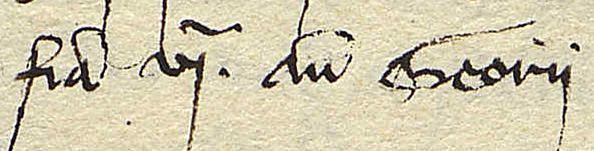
fia* vi* . an* Georii*
